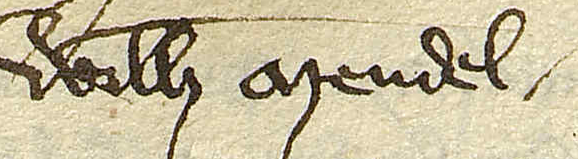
Wilh* Mendel /
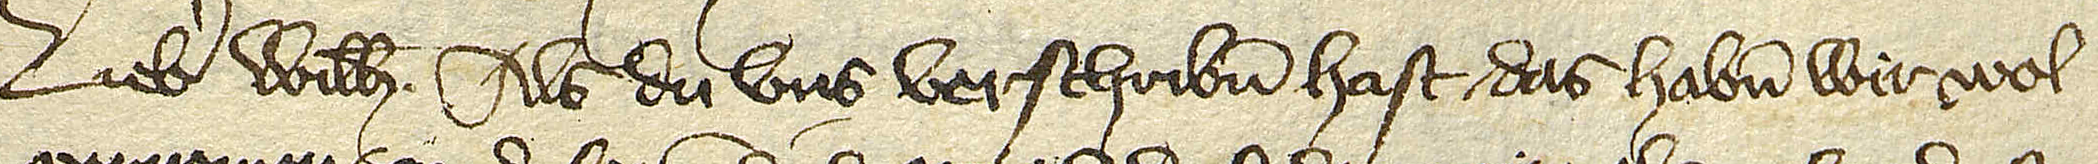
Lieb* Wilh* . Als du vns verſchribn* haſt / das habn* wir wol
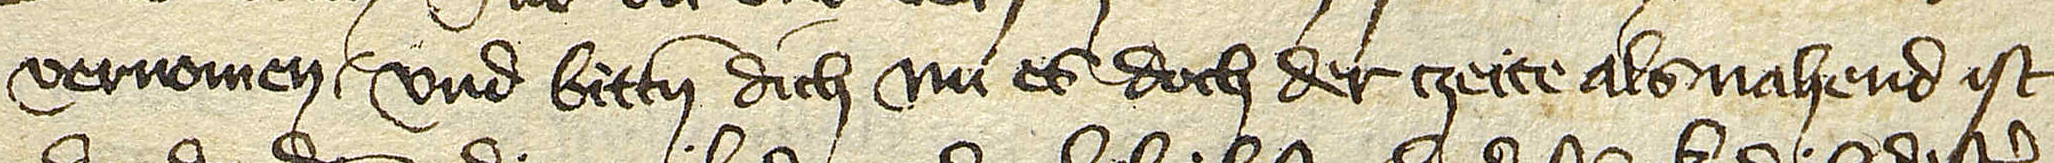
vernomen / vnd bittn* dich nu es doch der cʒeite als nahend iſt
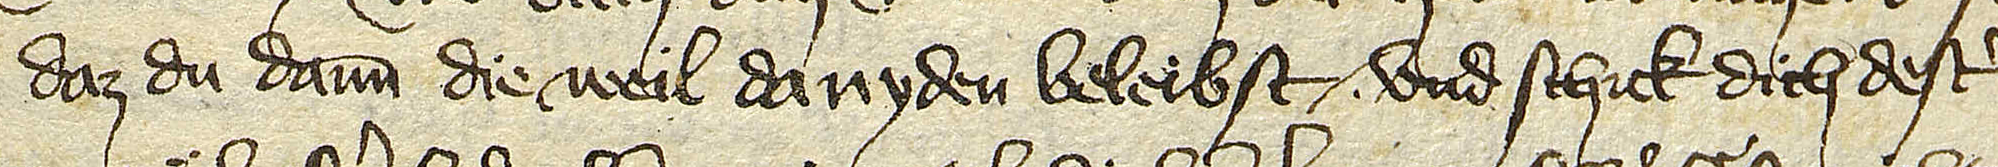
daʒ du dann die weil danyden beleibſt / . vnd ſchick dich deſt*
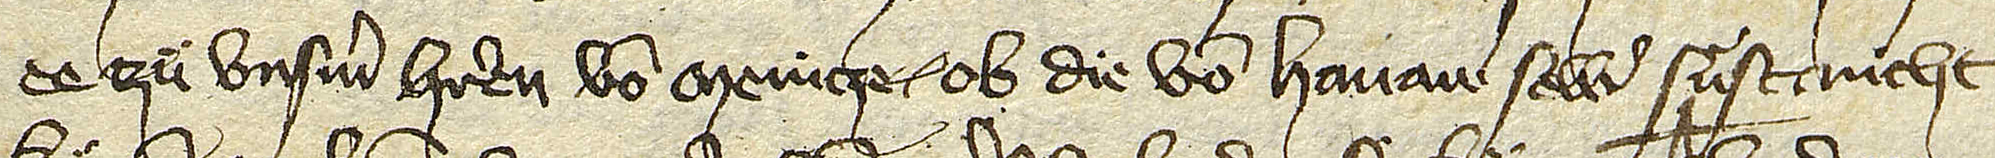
ee cʒü vnſm* hr*en vo* Meincʒe / ob die vo* hanaw ſelb* ſüſt / nicht
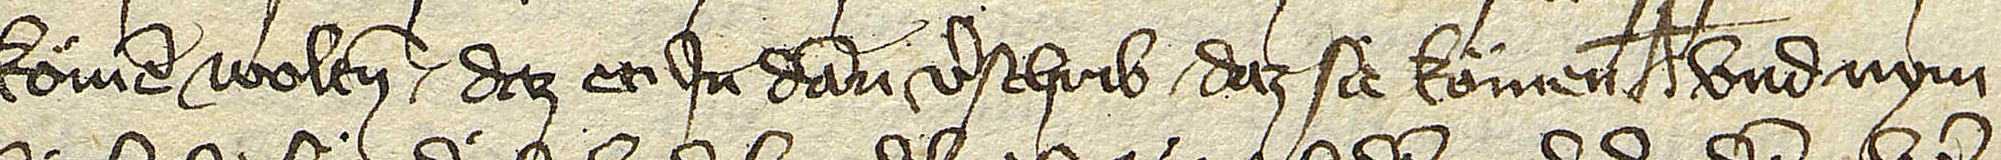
köme* woltn* / daʒ er In dan* v*ſchrib / daʒ ſie kömen / vnd nym
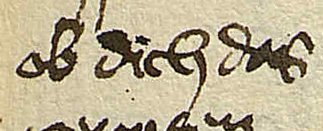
ob dich das
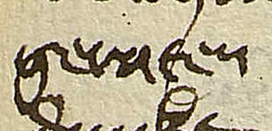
geraten
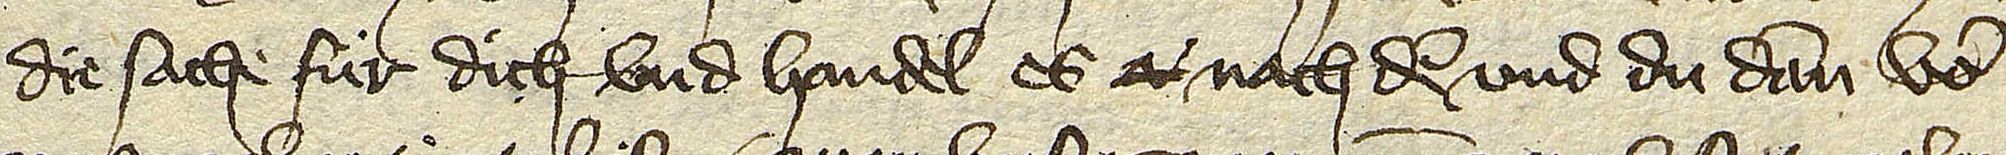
die ſache für dich vnd handel es a / nach d* vnd du dan* vo*
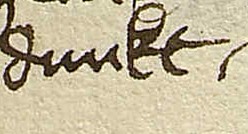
dunkt /
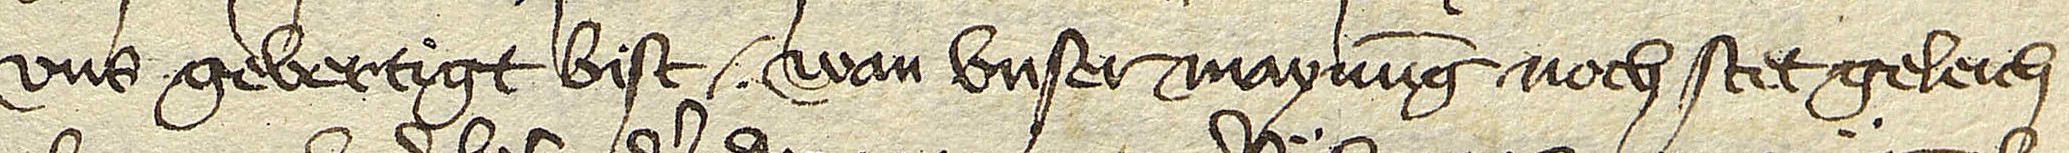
vns gevertigt biſt / . wan vnſer maynug* noch ſtet geleich
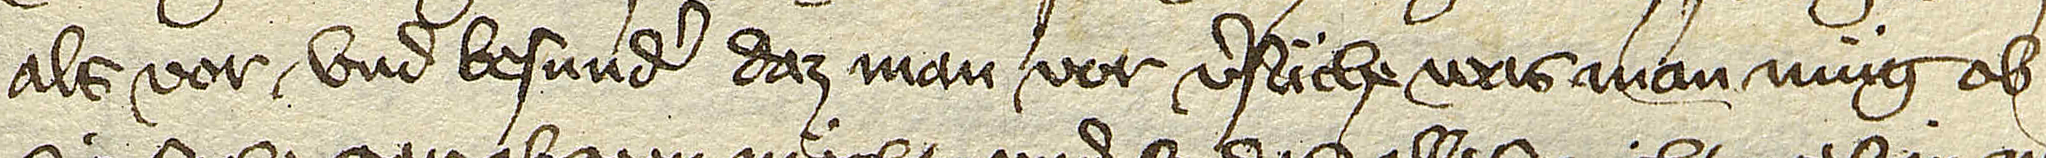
als vor / vnd beſund* daʒ man vor v*ſüche was man müg ob
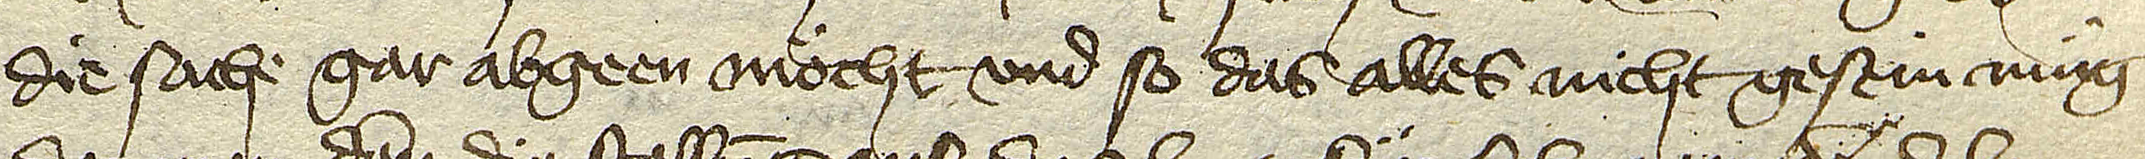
die ſache gar abgeen möcht vnd ſo das alles nicht geſein müg
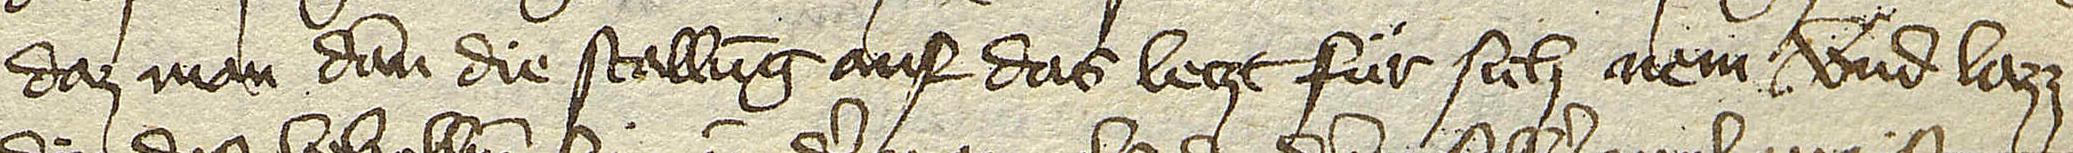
daʒ man dan* die ſtallug auf das lecʒt für ſich nem / vnd laʒʒ
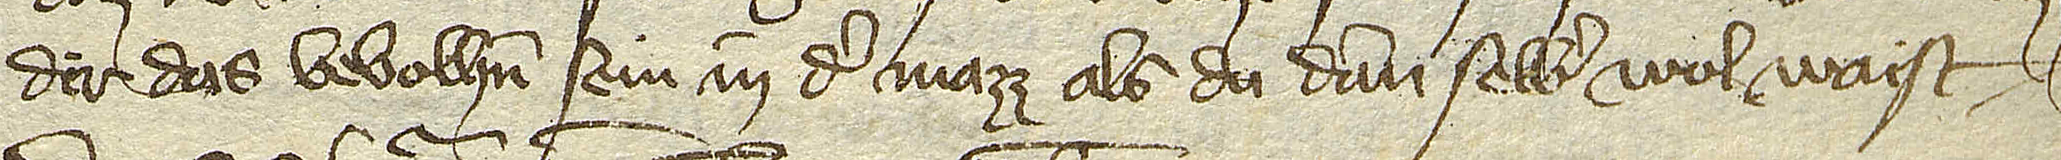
dir das bevolhn* ſein in d* maʒʒ als du dan* ſelb* wol waiſt /
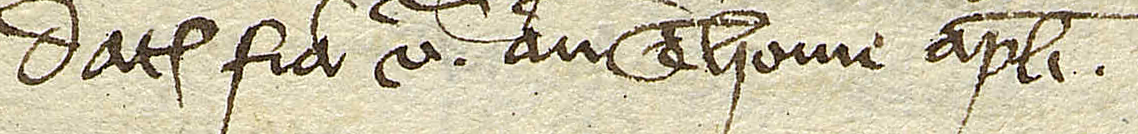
Dat* fia* v* . an* Thome apli* .
